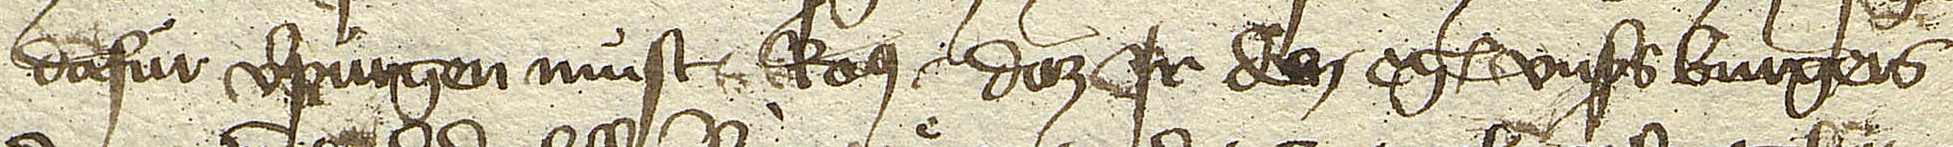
dafür v*pürgen müſt / Ro* / daʒ Ir dem eg* vnſ*s burgers
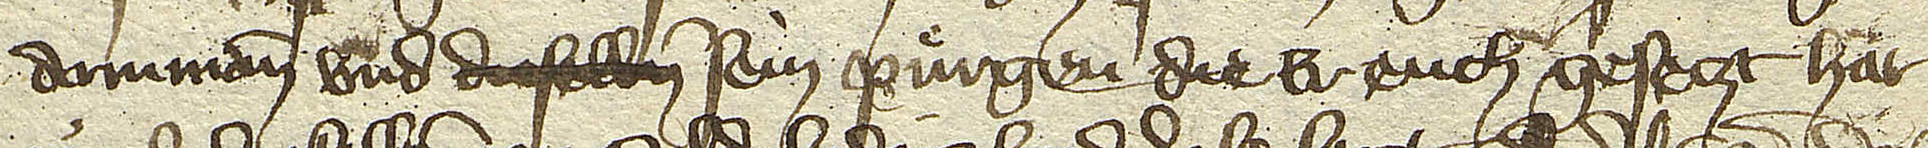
Armman* vnd dieſelbn* ſein pürgen die Er euch geſecʒt hat
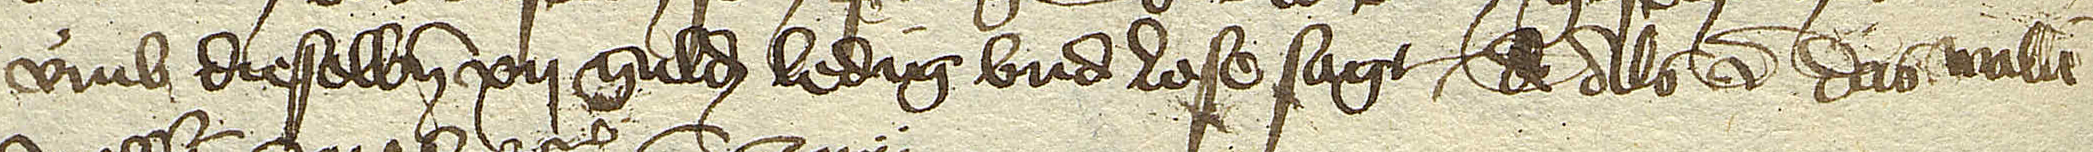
v̈mb dieſelbn* xii guld* ledig vnd loſe ſagt / d Als ec* das wolle*
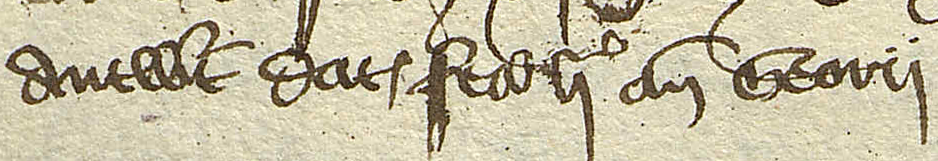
Antwt* dat* fea* ii* an* Georii*
